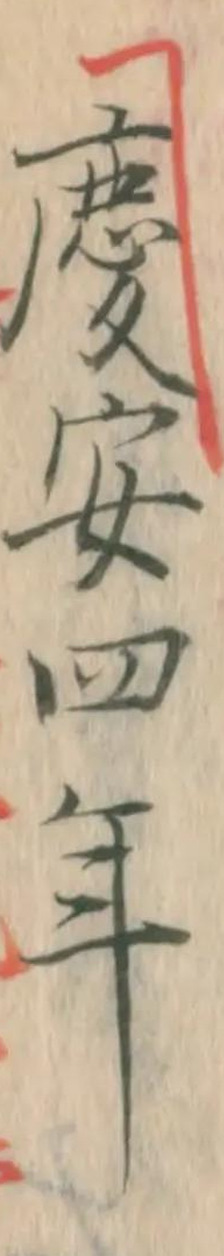慶安四年
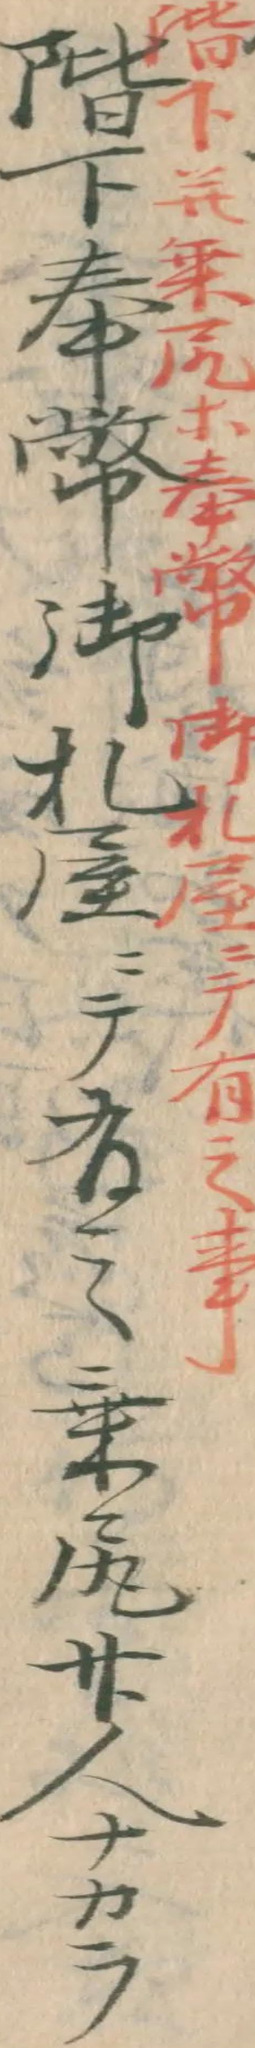階下奉幣御札屋ニテ有之乗尻廿人ナカラ
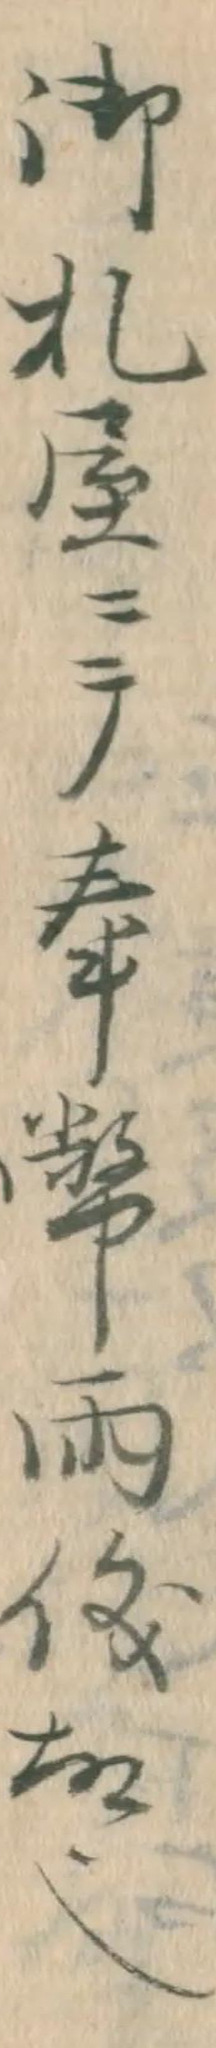御札屋ニテ奉幣雨儀故也
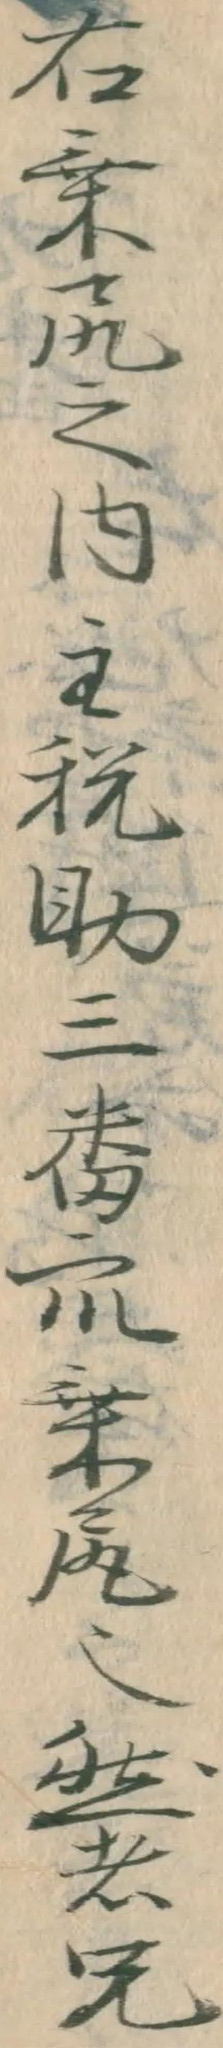右乗尻之内主税助三番衆乗尻也然者兄
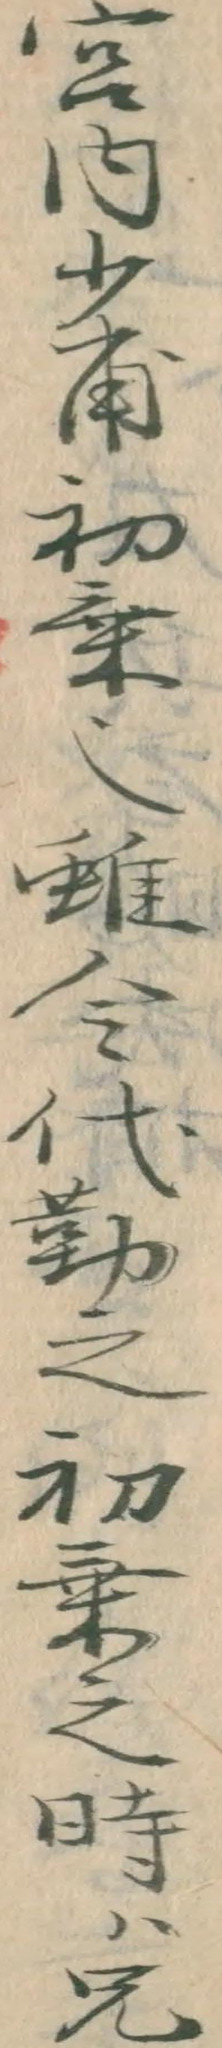宮内少輔初乗也雖令代勤之初乗之時ハ兄
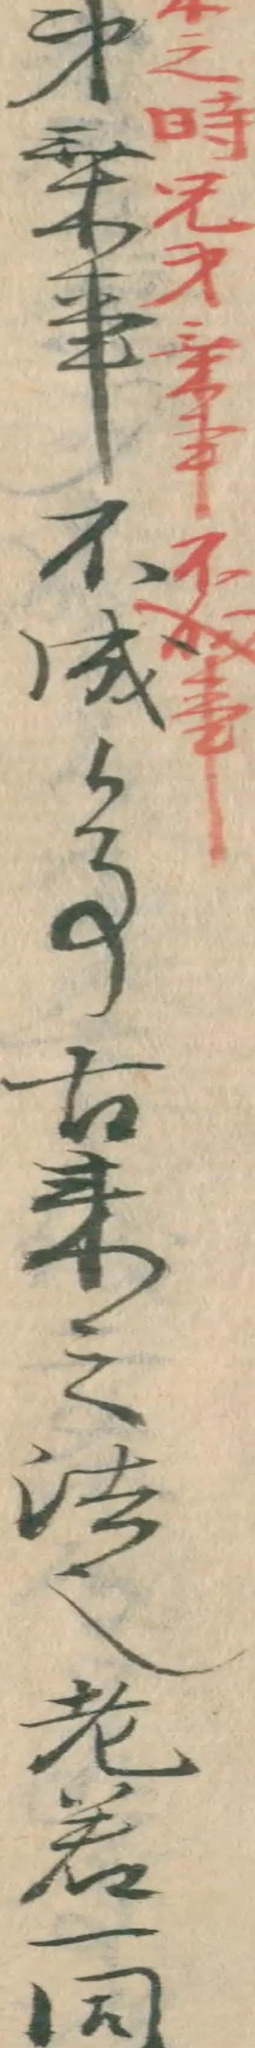弟乗事不成候事古来之法也老若一同
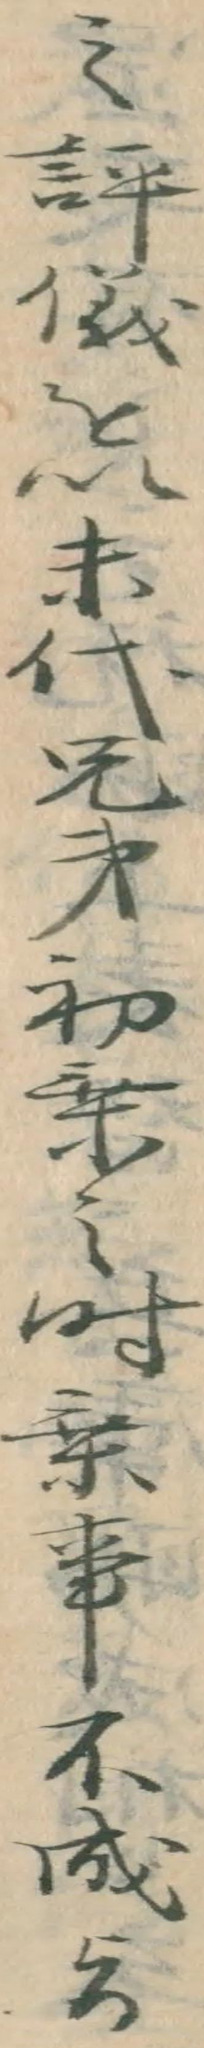之評議を以末代兄弟初乗之時乗事不成旨

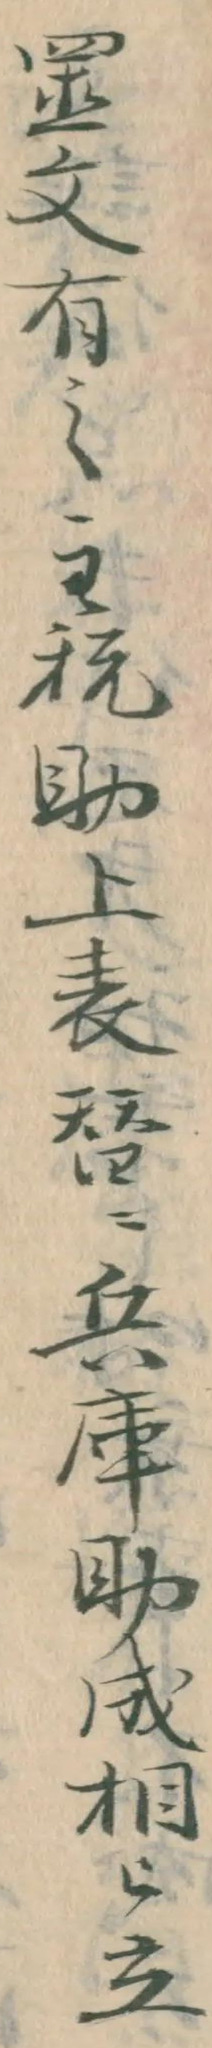置文有之主税助上表替ニ兵庫助成相被立
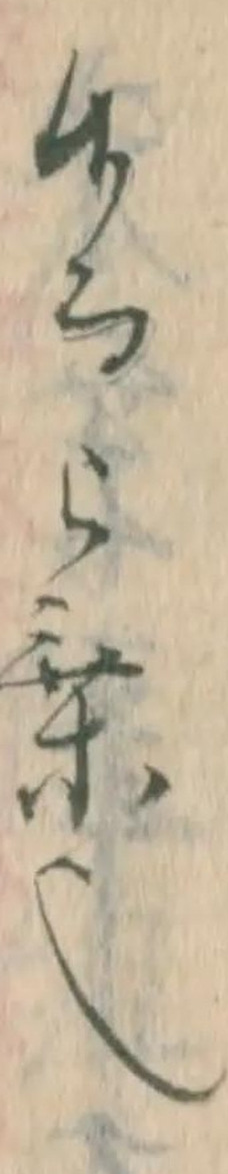候而被乗也
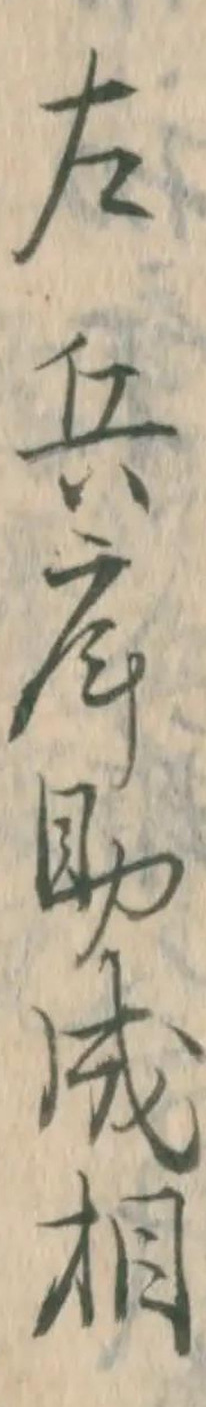左兵庫助成相
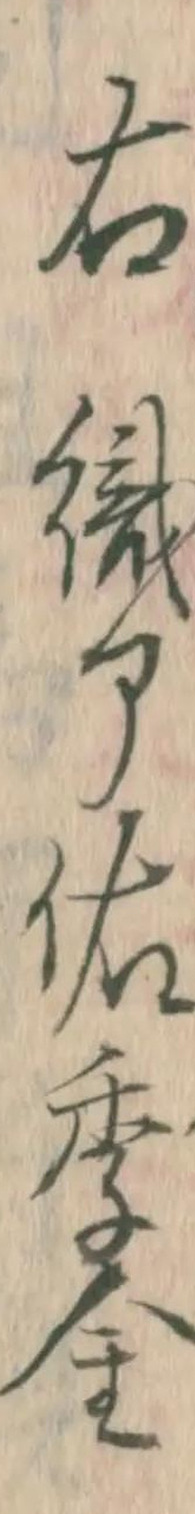右織部祐季金
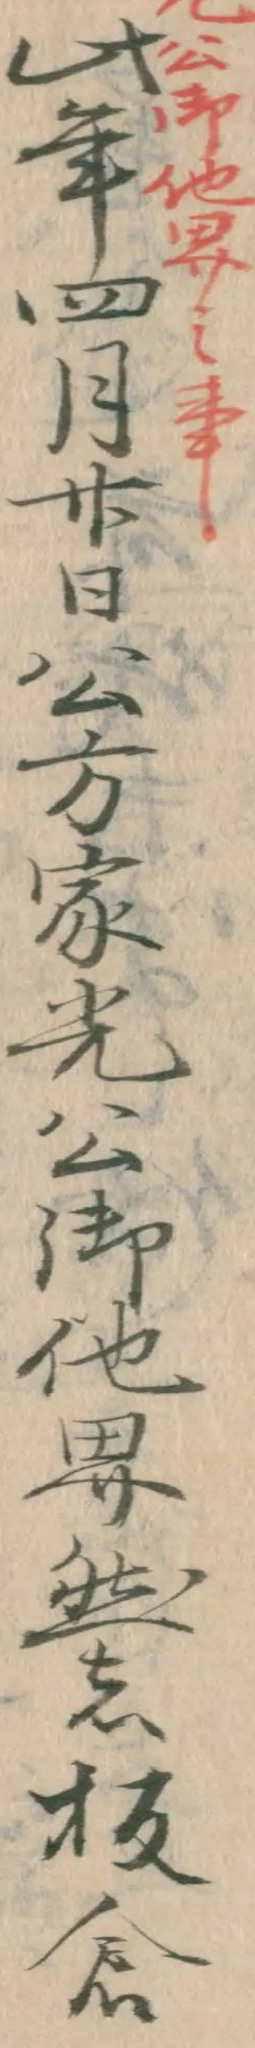此年四月廿日公方家光公御他界然者板倉
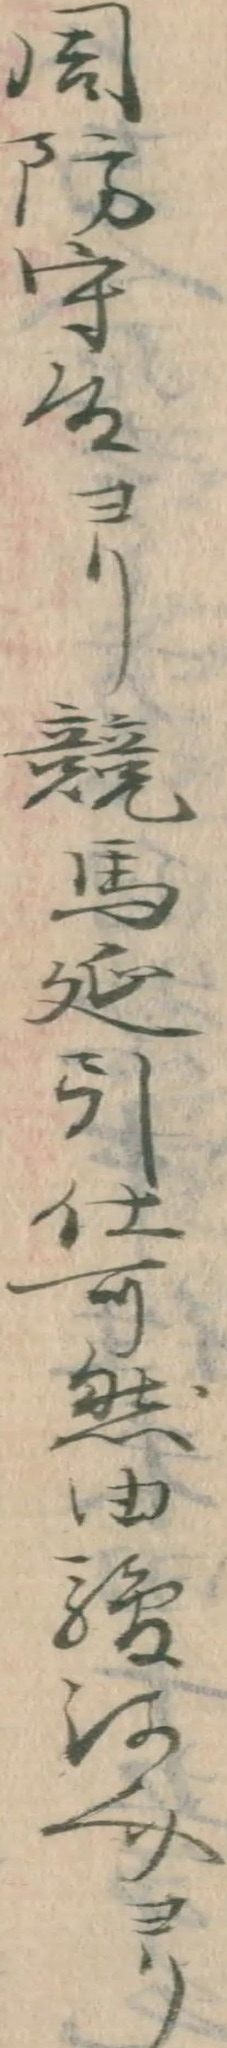周防守殿ヨリ競馬延引仕可然由駿河介ヨリ
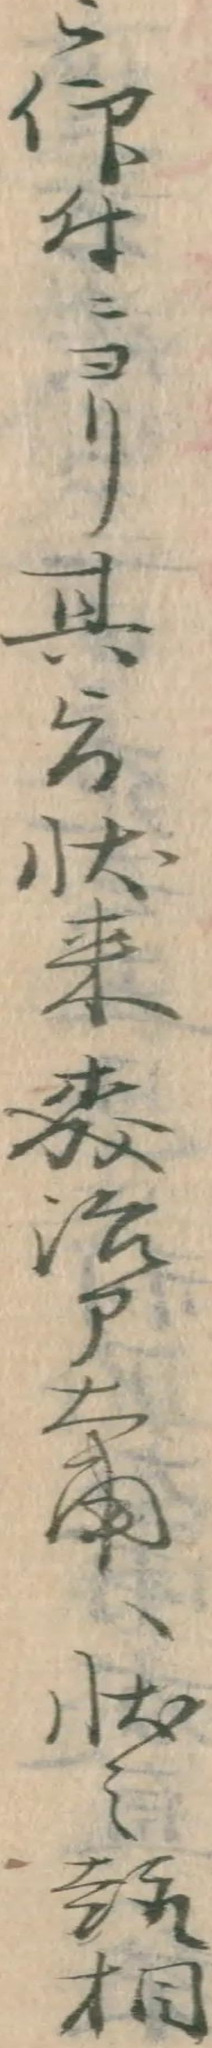被仰付ニヨリ其旨状来森治部大輔へ状之趣相
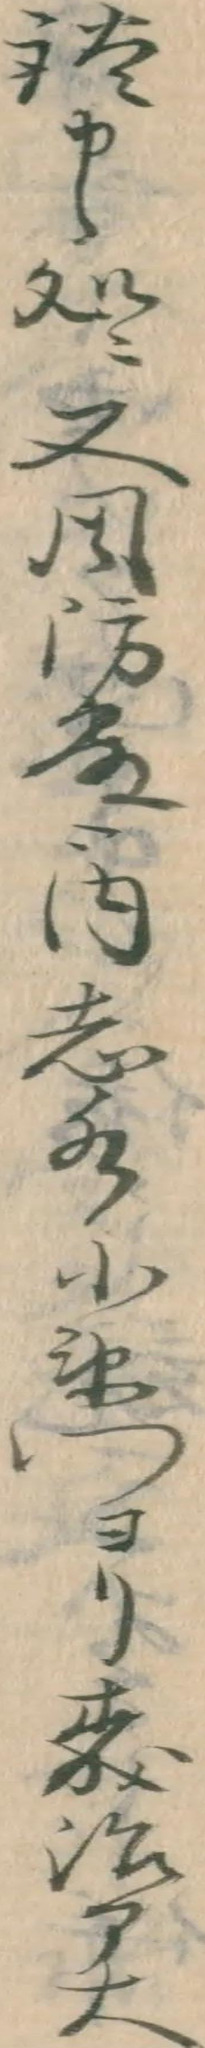談申候処ニ又周防殿御内志水小衛門ヨリ森治部大
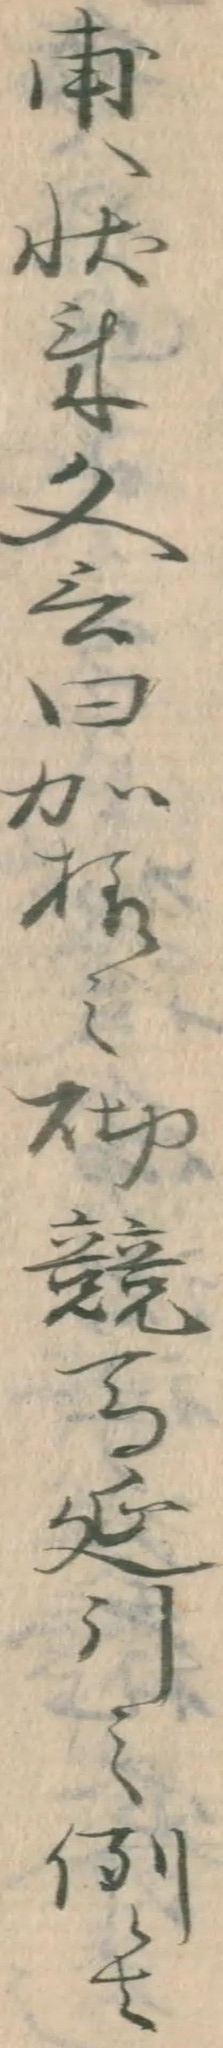輔へ状来文言曰加様之砌競馬延引之例候は
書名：賀茂社記録. 第10冊
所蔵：国立国会図書館 National Diet Library, JAPAN
